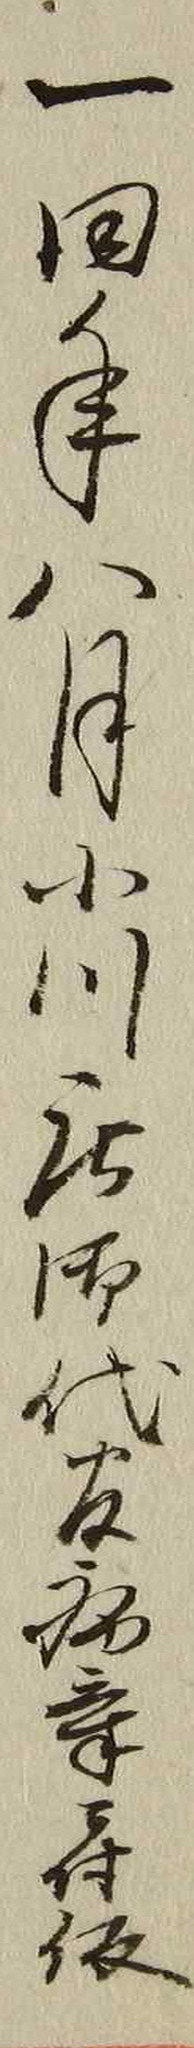一同年八月小川庄御代官病気ニ付仮
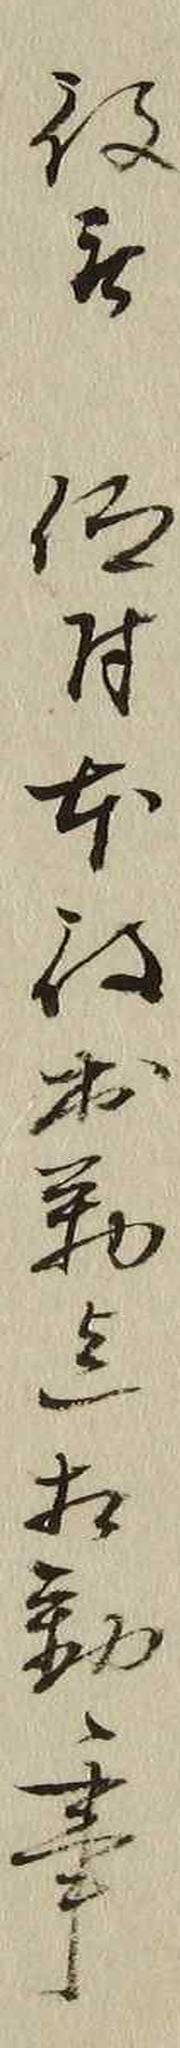役被仰付本役出勤迄相勤候事
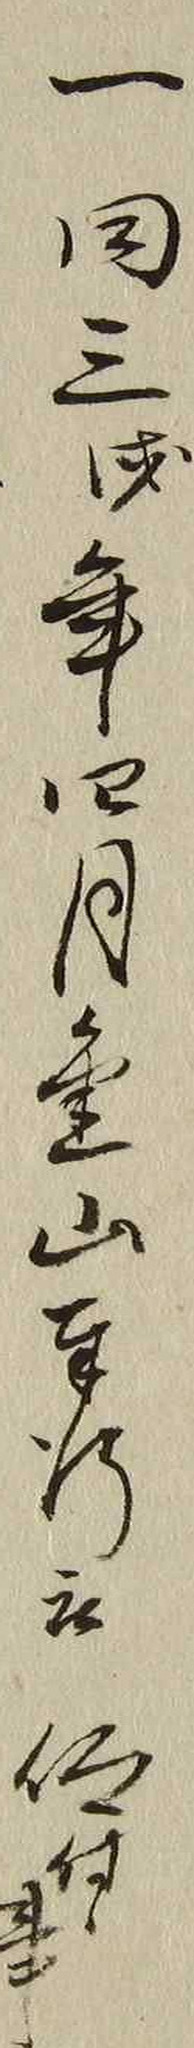一同三戌年四月金山奉行被仰付候事
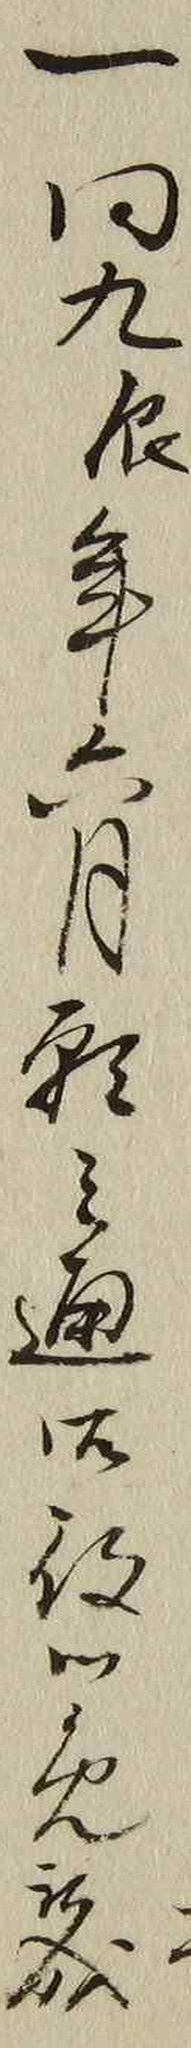一同九辰年六月願之通御役御免被成
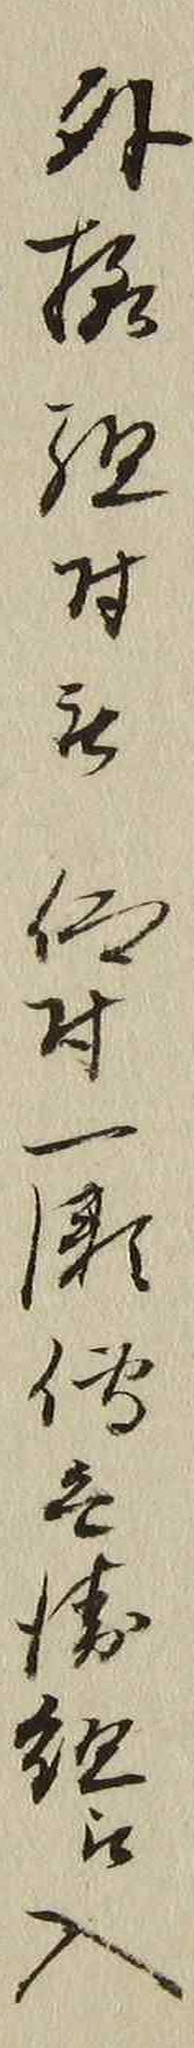外様組付被仰付一瀬伝兵衛組江入
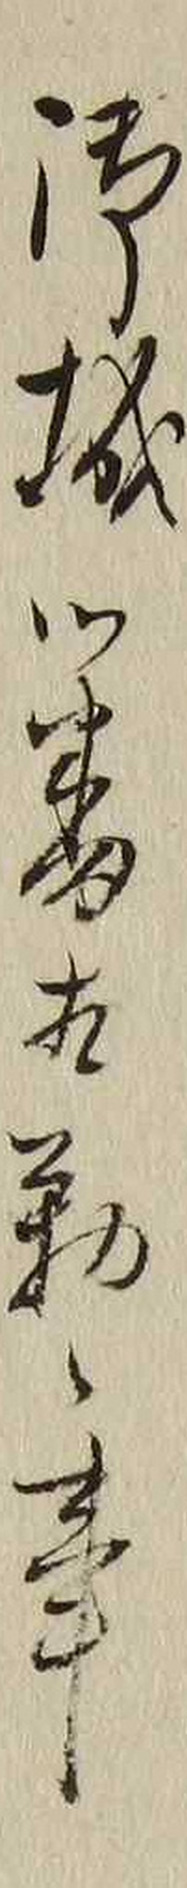御城御番相勤候事
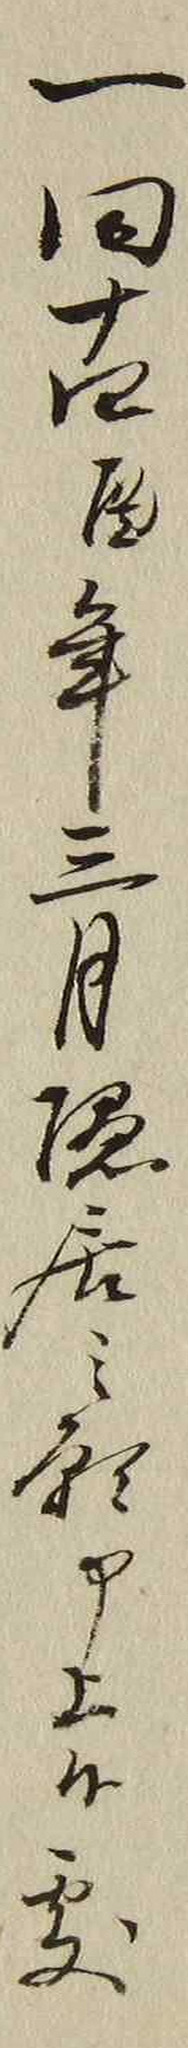一同十四酉年三月隠居之願申上候処
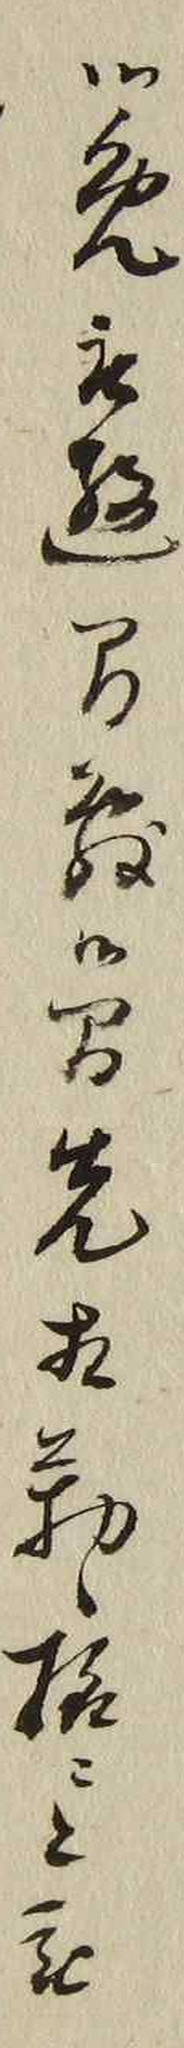御免被遊間敷候間先相勤候様ニと被
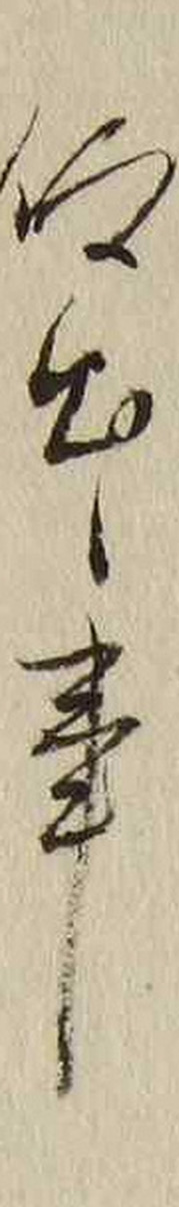仰出候事
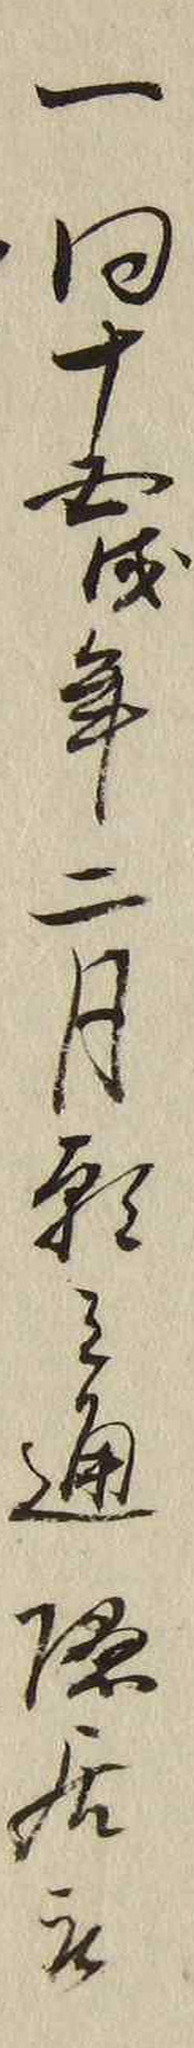一同十五戌年二月願之通隠居被
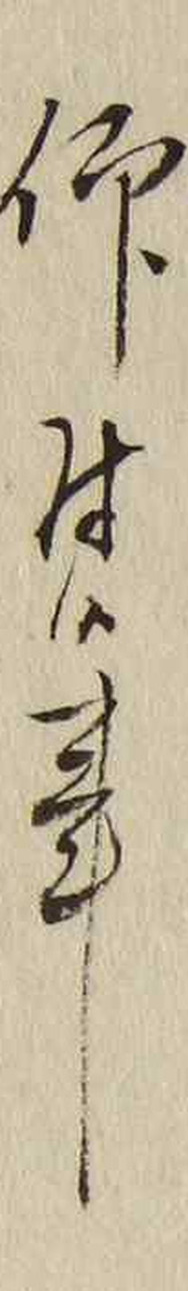仰付候事

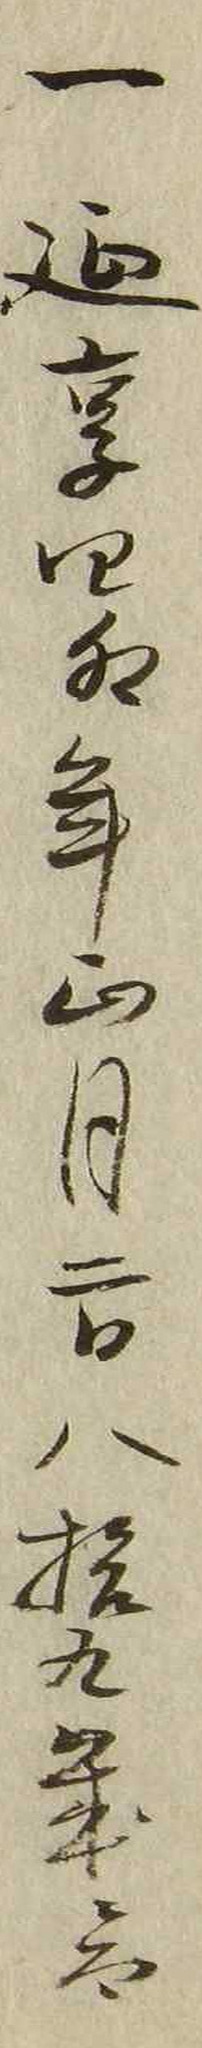一延享四卯年正月二日八拾九歳ニ而
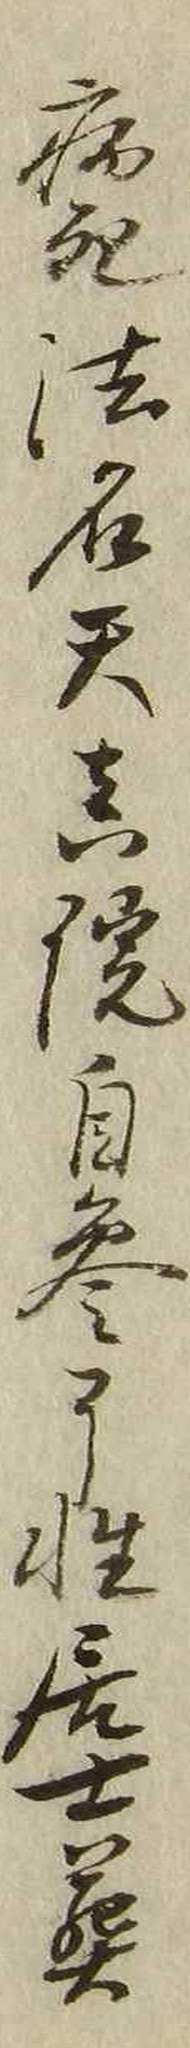病死法名天真院自参了性居士葬
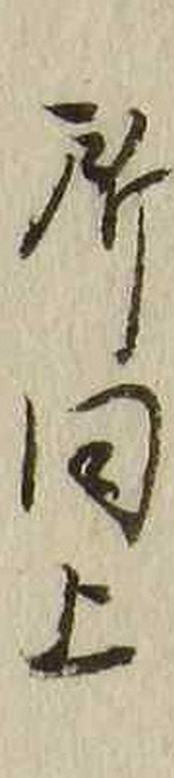所同上
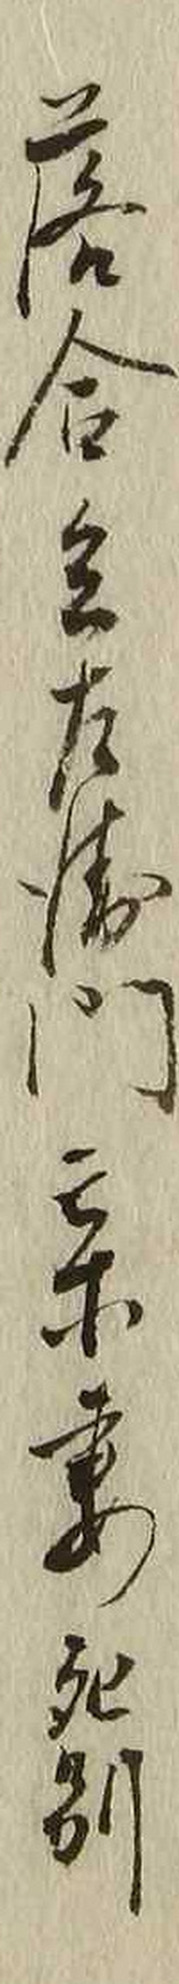女落合兵左衛門某妻死別
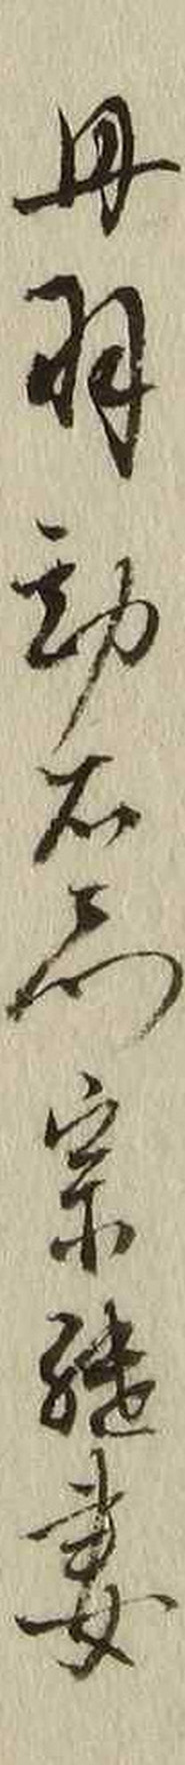丹羽勘右衛門宗継妻
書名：諸士系譜　巻之359　す之部9
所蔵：会津若松市立会津図書館
